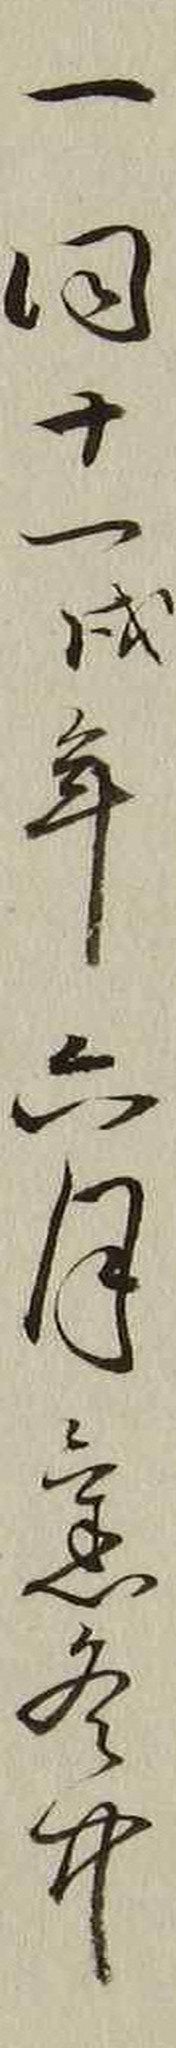一同十一戌年六月旧冬中
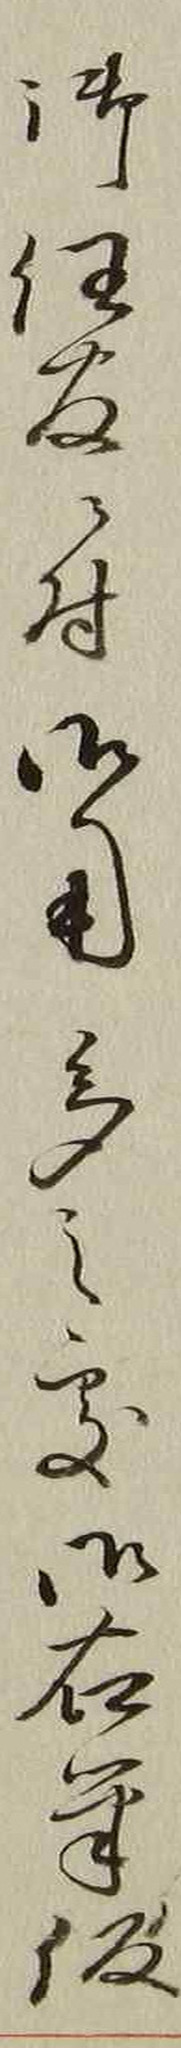御任官ニ付御用多之処御右筆仮
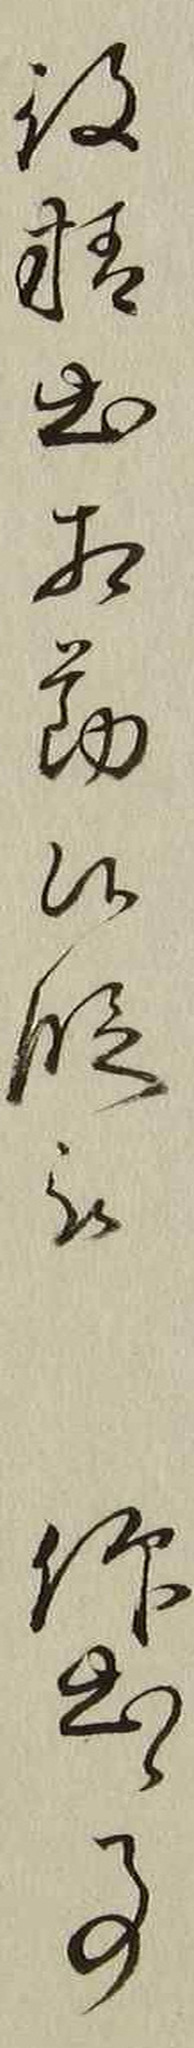役精出相勤候段被仰出候事
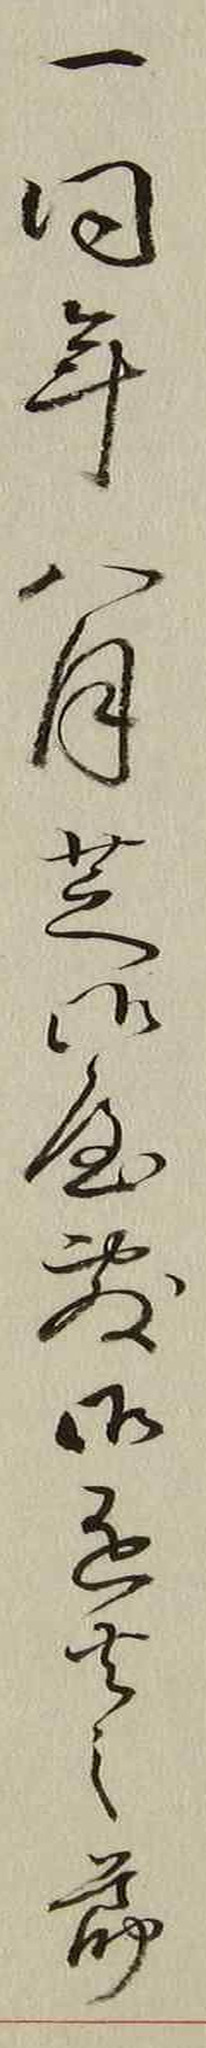一同年八月芝御屋敷御懸去之節
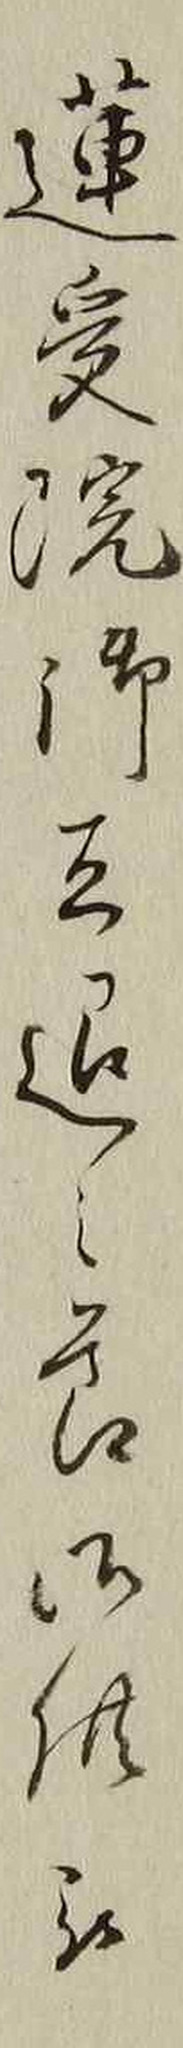蓮受院御立退之節御供被
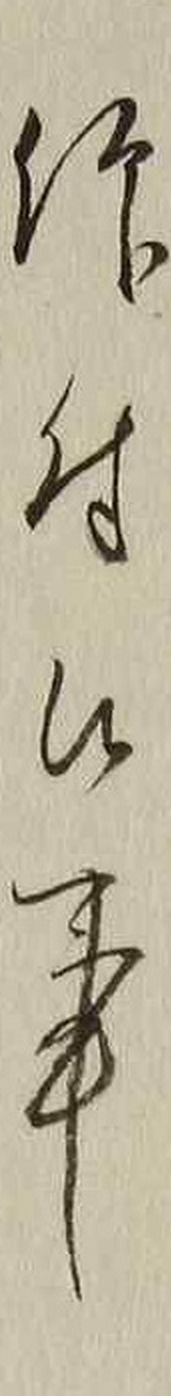仰付候事
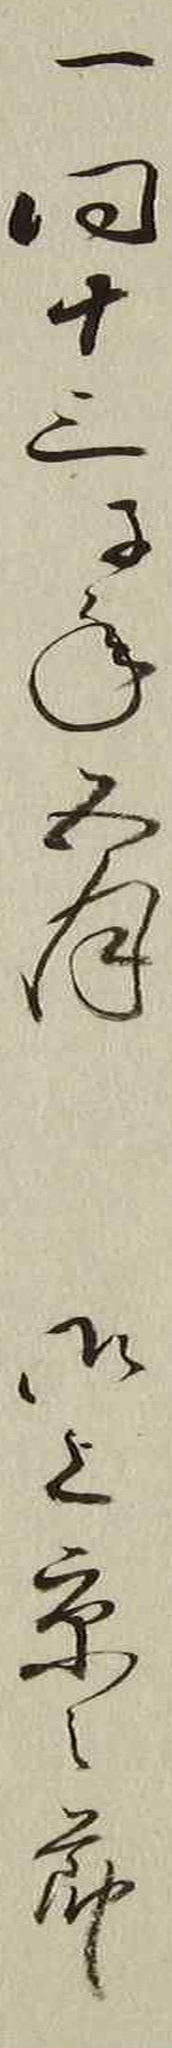一同十三子年五月御上京之節
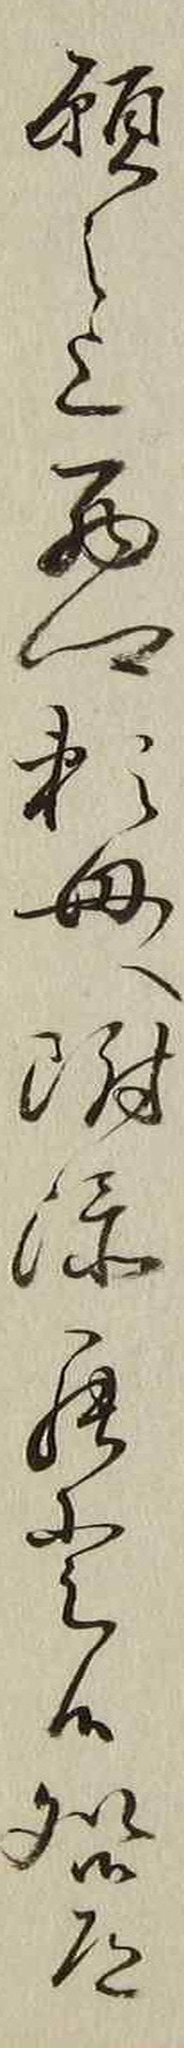願之上西郷頼母へ附添罷登候処御道
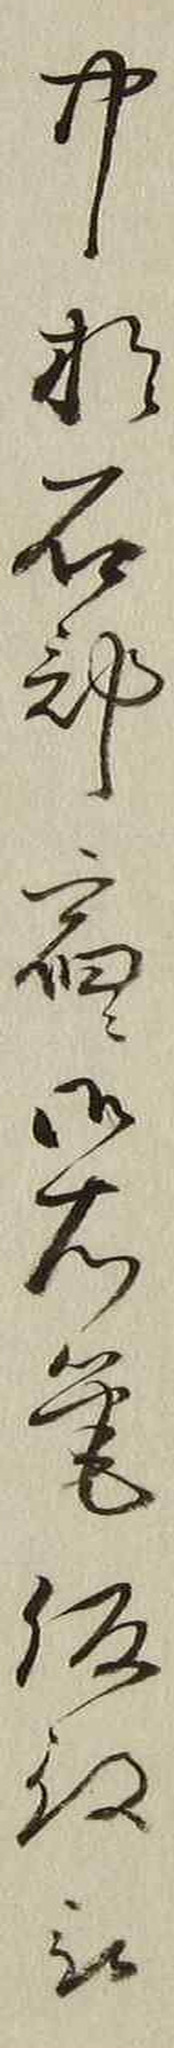中於石部宿ニ御右筆仮役被
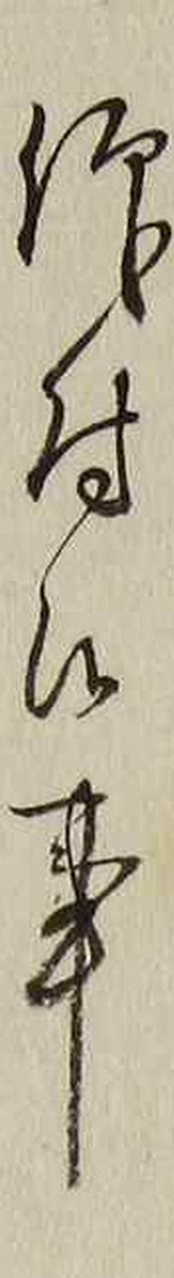仰付候事
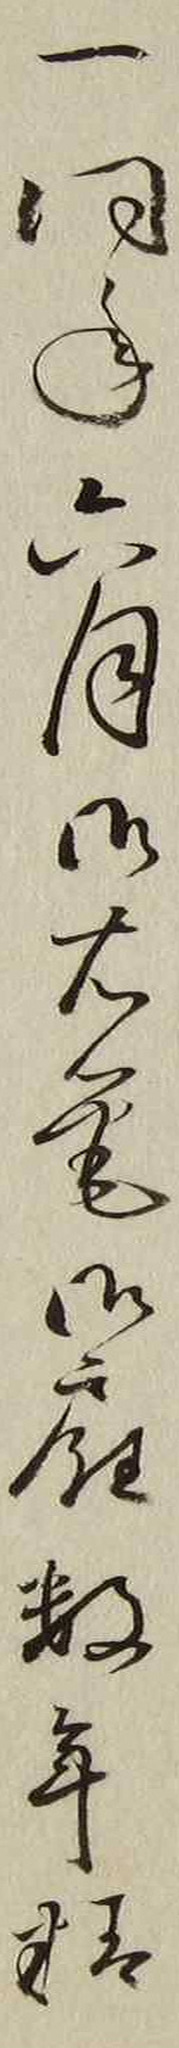一同年六月御右筆御雇数年精
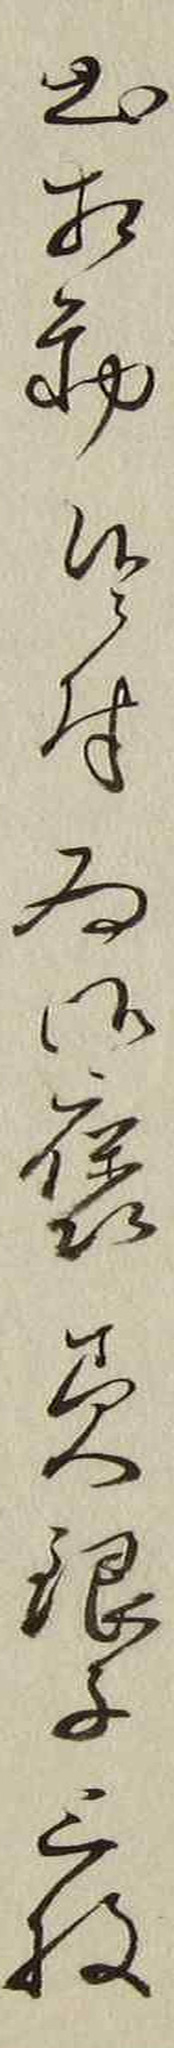出相勤候ニ付為御褒美銀子三枚
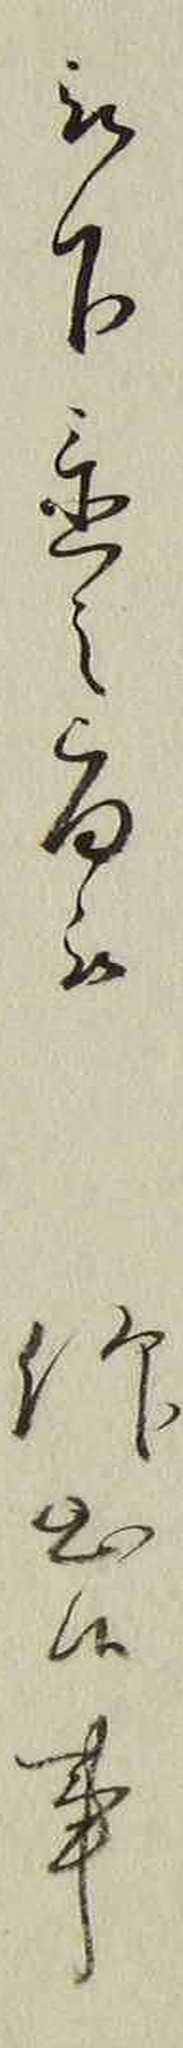被下置之旨被仰出候事
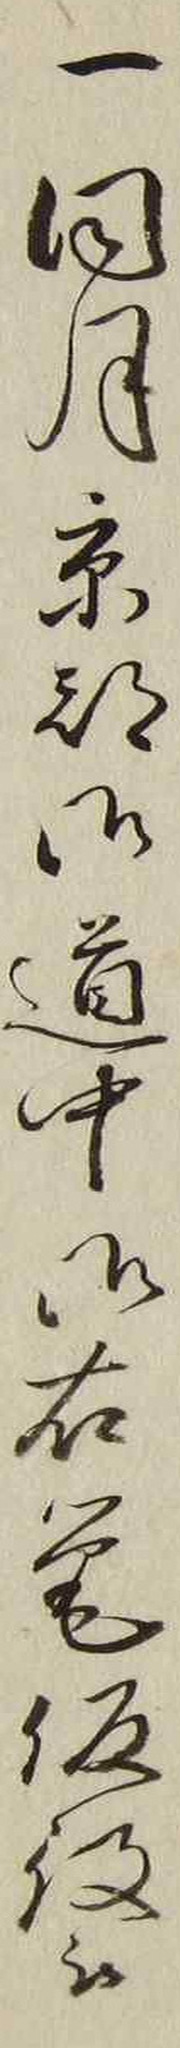一同月京都御道中御右筆仮役被

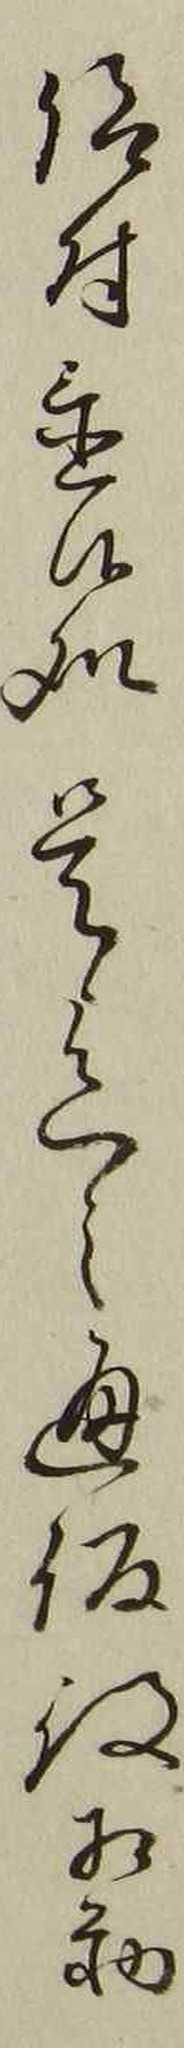仰付置候処是迄之通仮役相勤
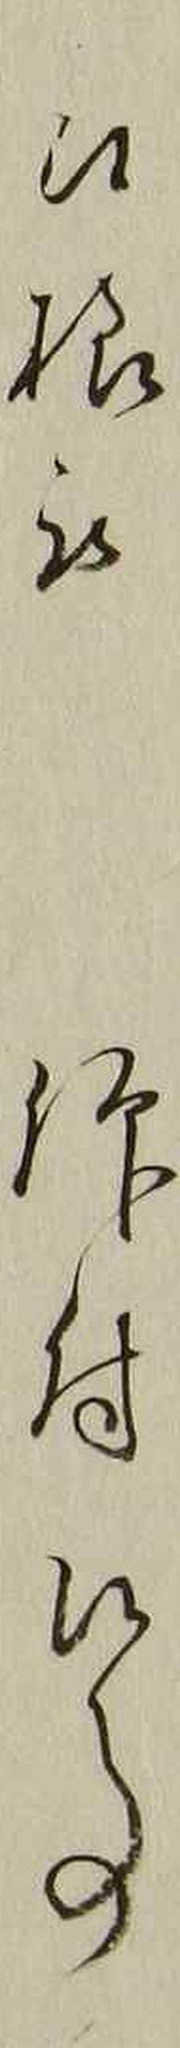候様被仰付候事
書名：諸士系譜　巻之4　い之部4
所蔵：会津若松市立会津図書館
